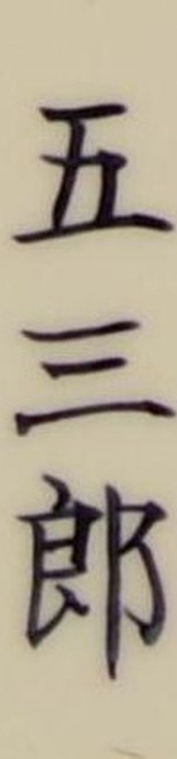五三郎
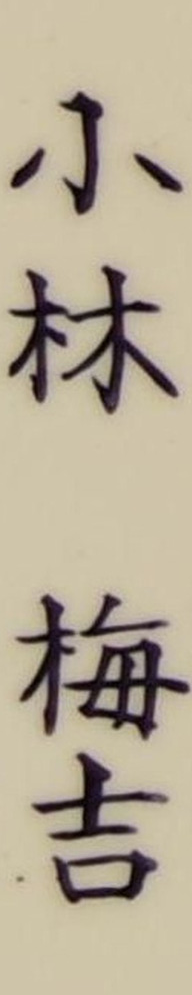小林梅吉
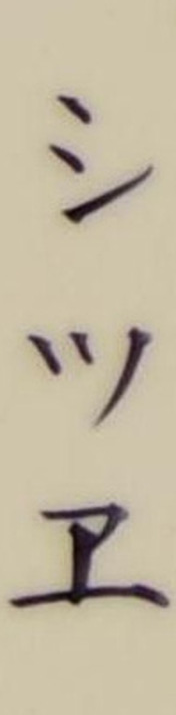シツエ

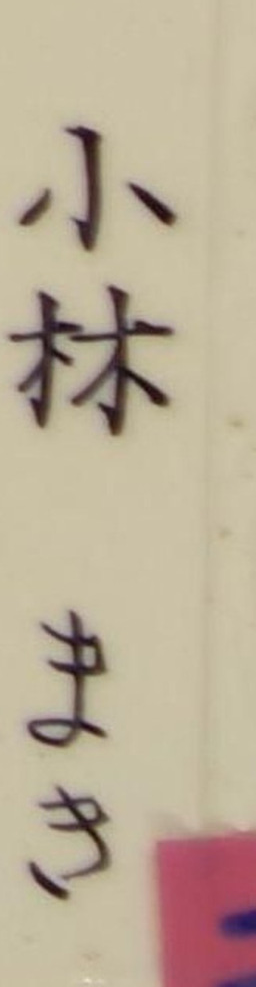小林まき
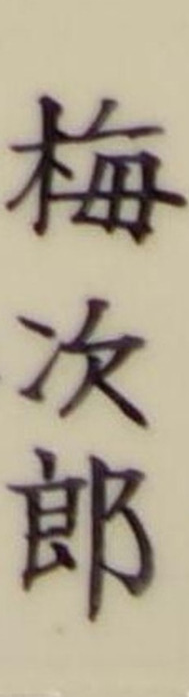梅次郎
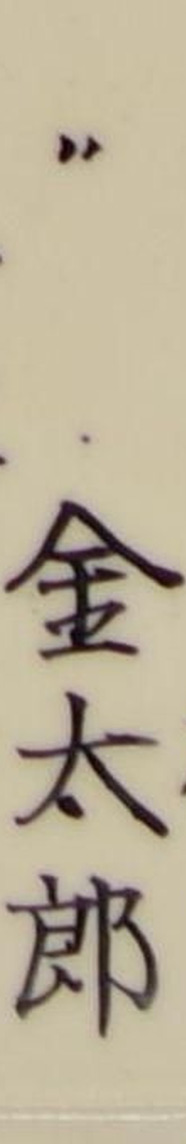金太郎
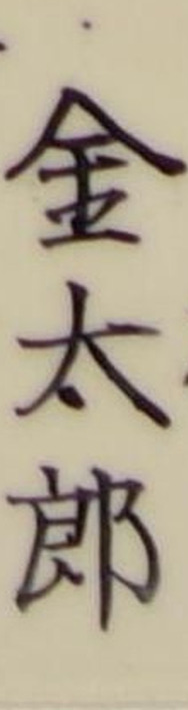金太郎
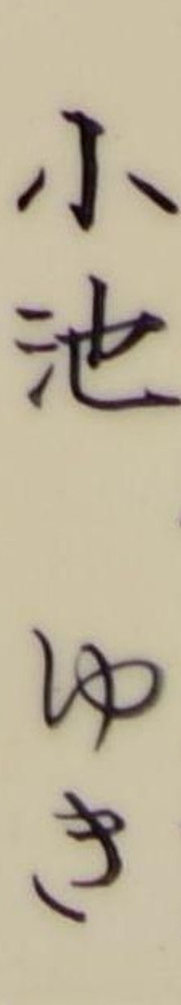小池ゆき
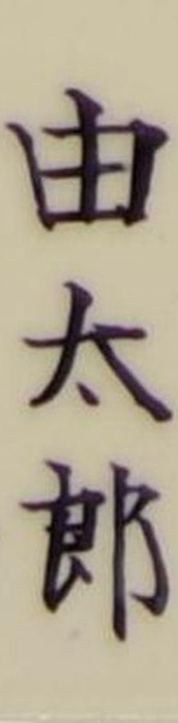由太郎
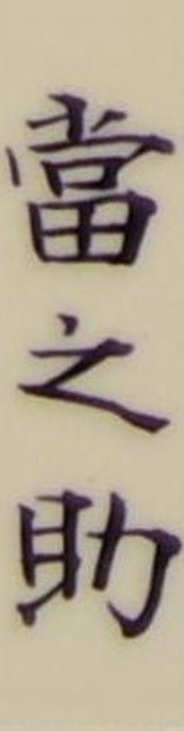富之助
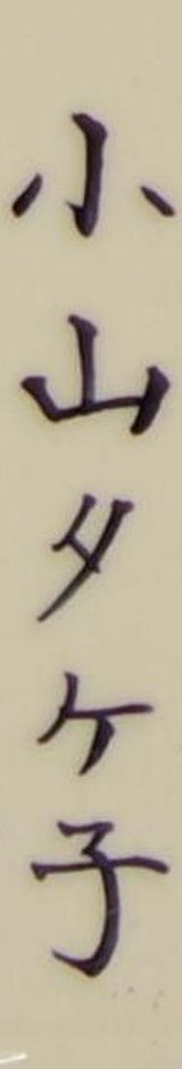小山タケ子
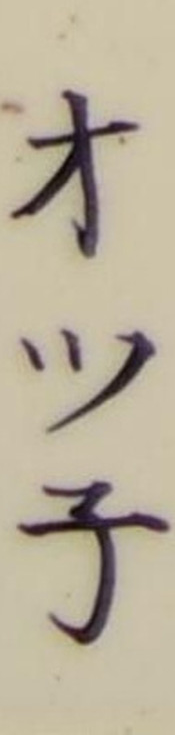オツ子

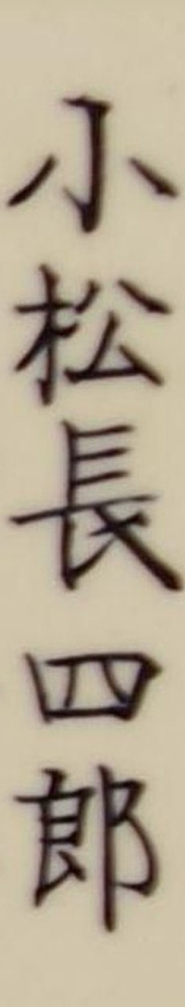小松長四郎
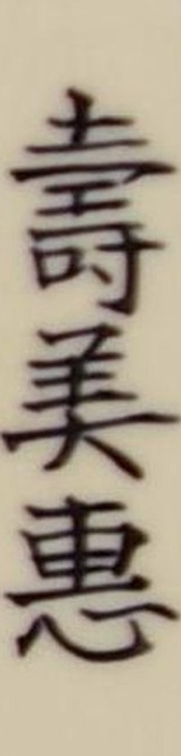壽美恵
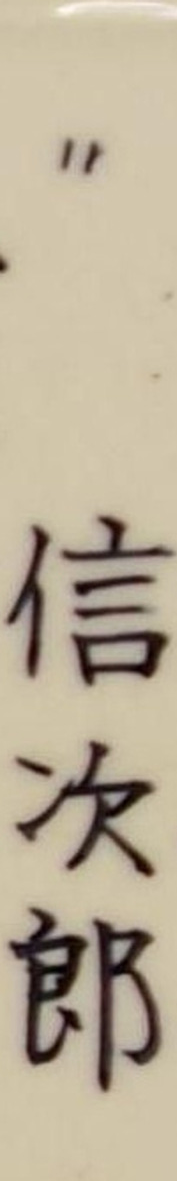信次郎
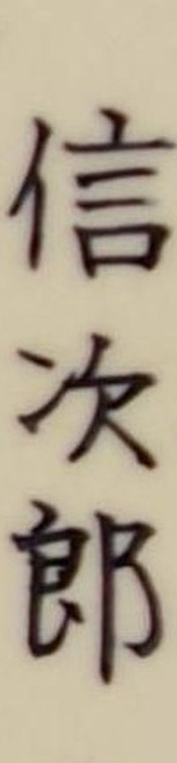信次郎
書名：E~L
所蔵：高野山金剛峯寺
